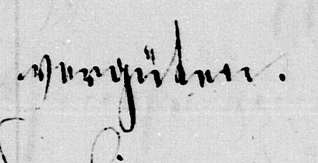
vergüten.
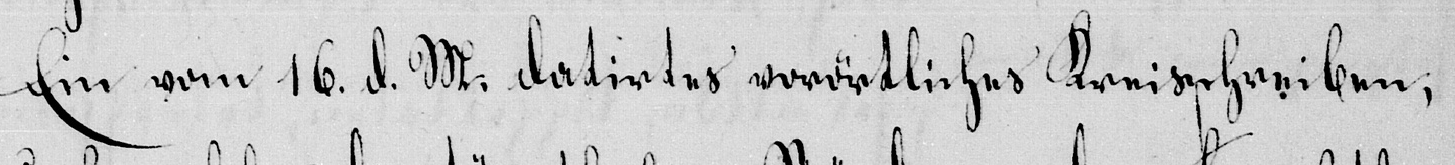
Ein vom 16. d. M. datirtes vorörtliches Kreisschreiben,
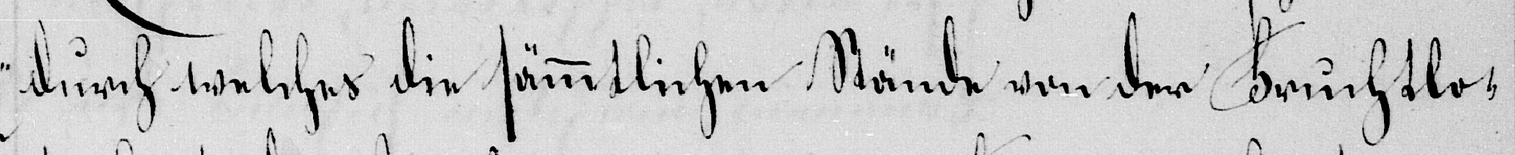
durch welches die sämmtlichen Stände von der Fruchtlos¬
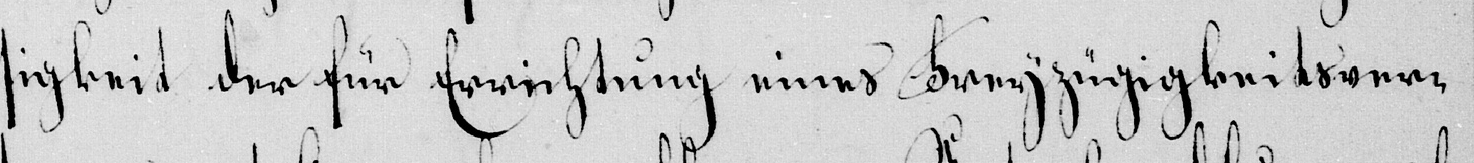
igkeit der für Errichtung eines Freyzügigkeitsver¬
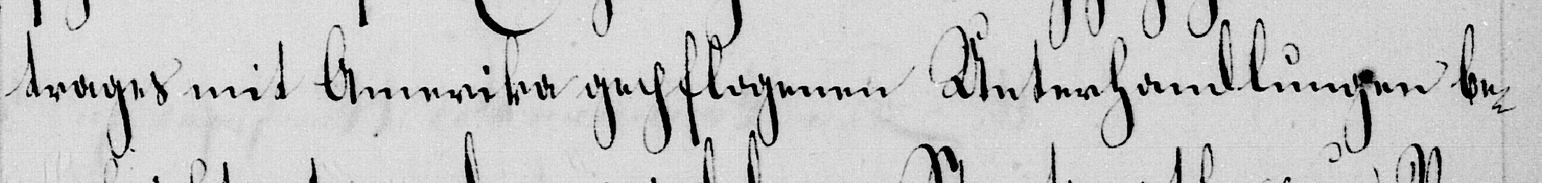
trages mit Amerika gepflogenen Unterhandlungen be¬
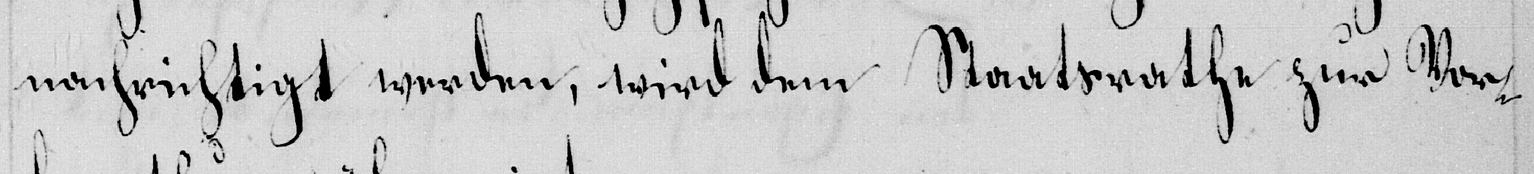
nachrichtigt werden, wird dem Staatsrathe zur Vor¬
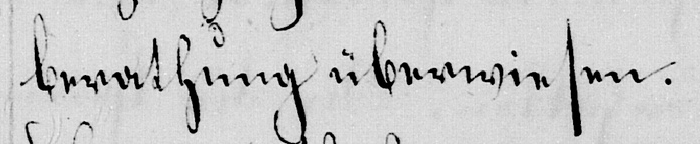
berathung überwiesen.
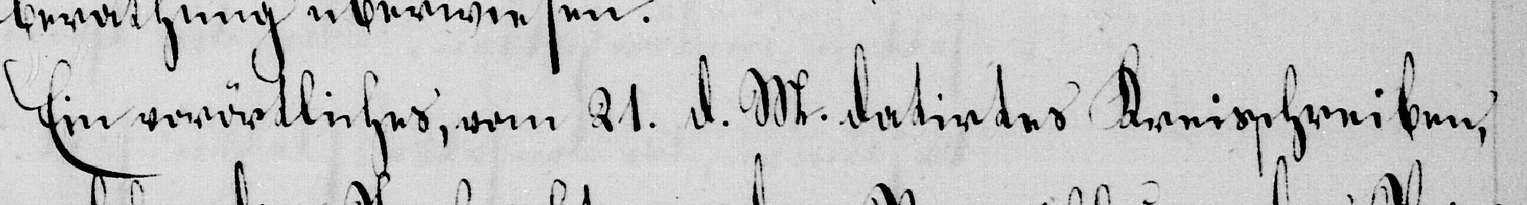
Ein vorörtliches, vom 21. d. M. datirtes Kreisschreiben,
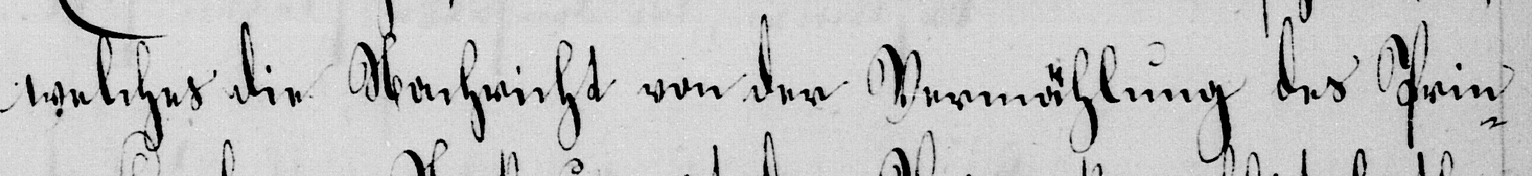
welches die Nachricht von der Vermählung des Prin¬
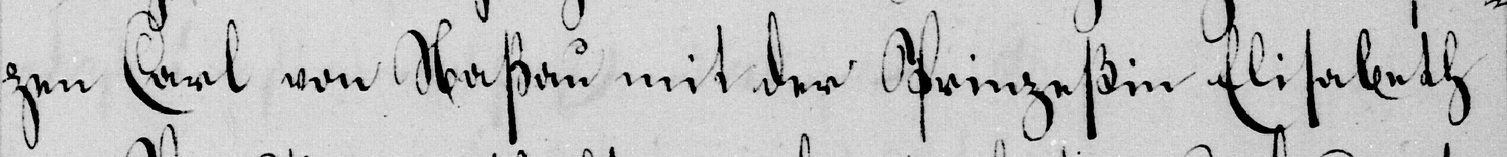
zen Carl von Naßau mit der Prinzeßin Elisabeth
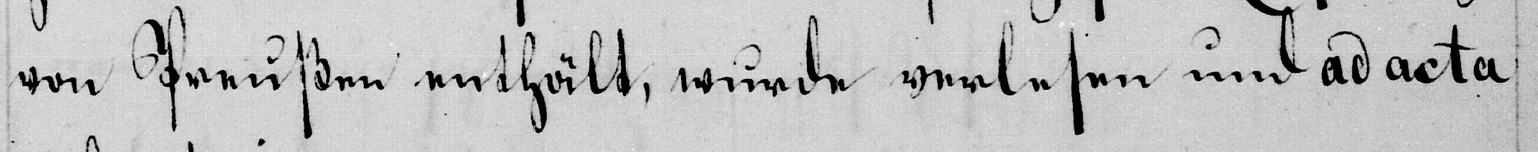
von Preußen enthält, wurde verlesen und ad acta
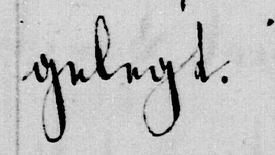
gelegt.
